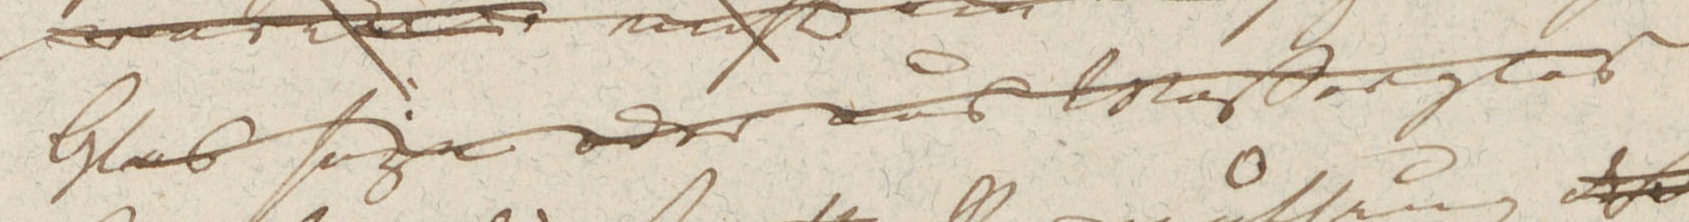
Glas seyn oder aus Wasserglas
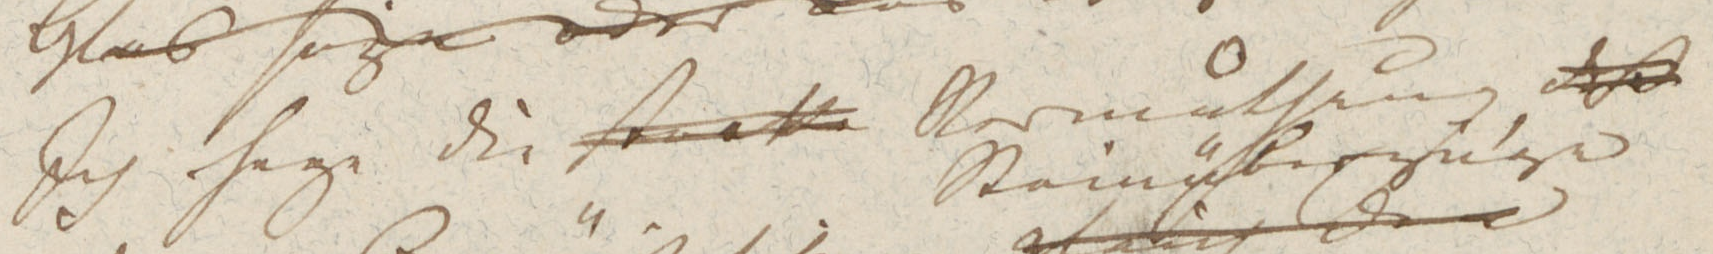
Ich hege die starke Vermuthung, dass
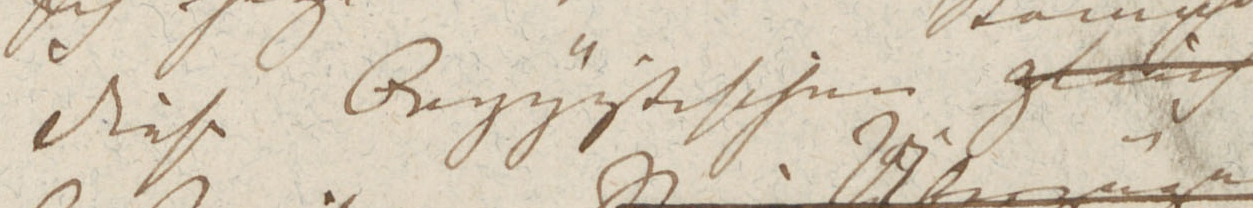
diese Aegyptischen gleich den
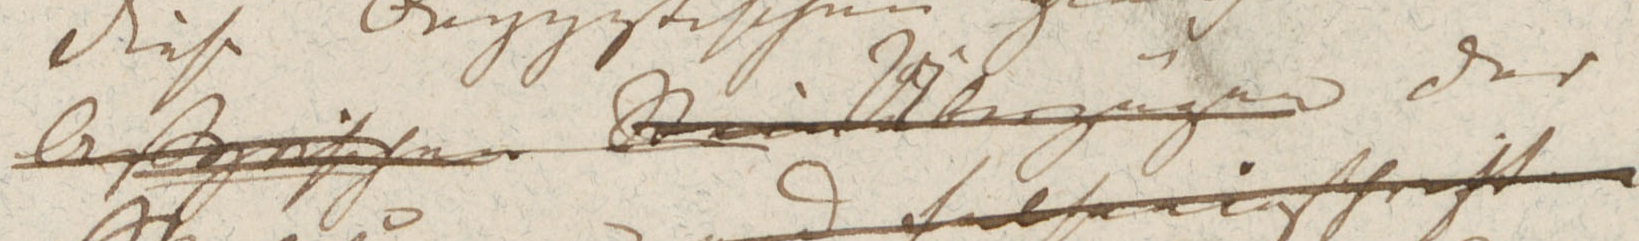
Assyrischen Steinüberzügen der
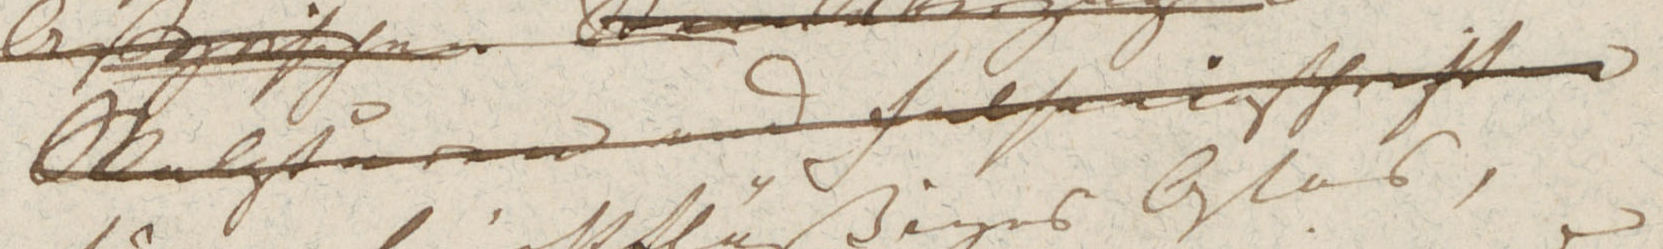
Skulpturen und Felseninschriften
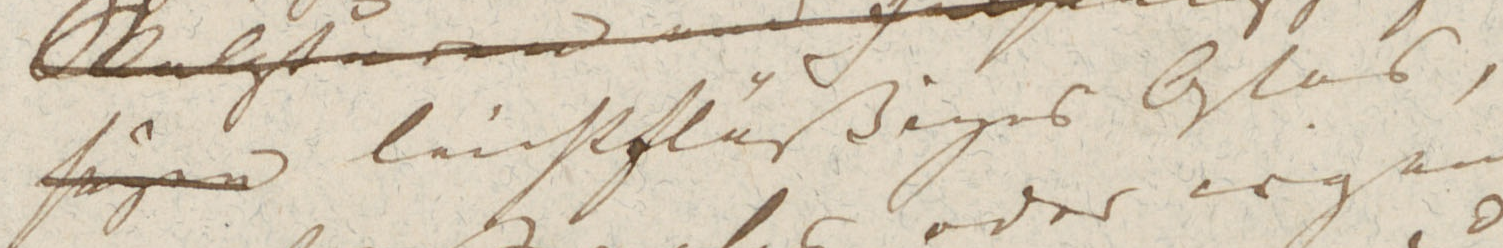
seyen leichtflüssiges Glas,
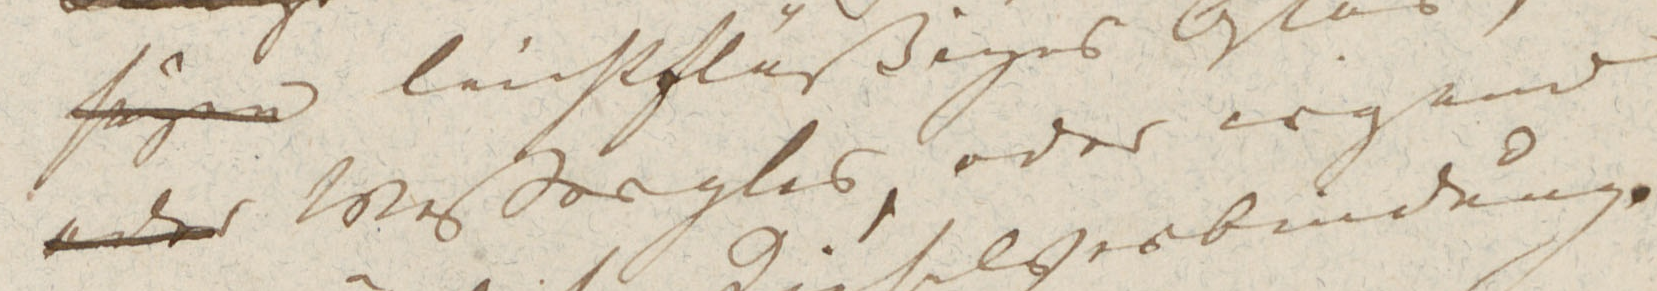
oder Wasserglas, oder irgend
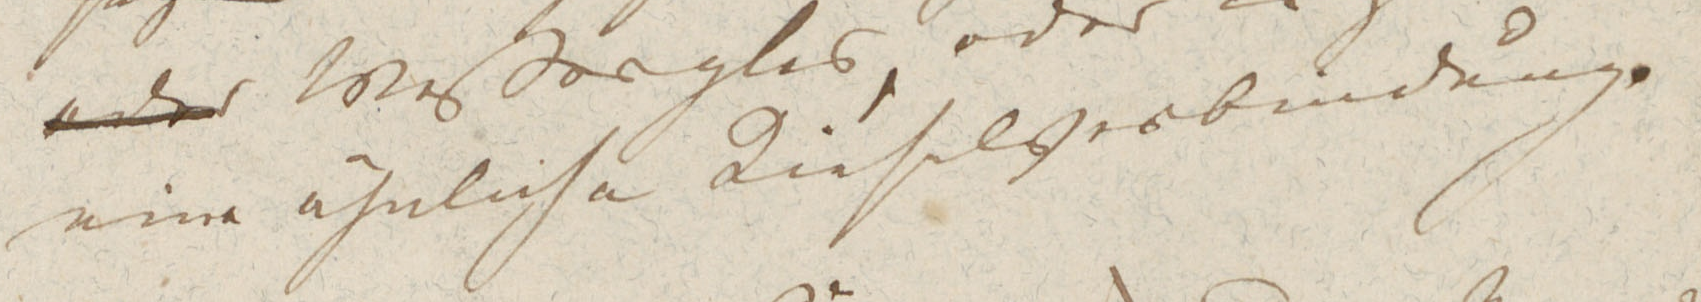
eine ähnliche Kieselverbindung.
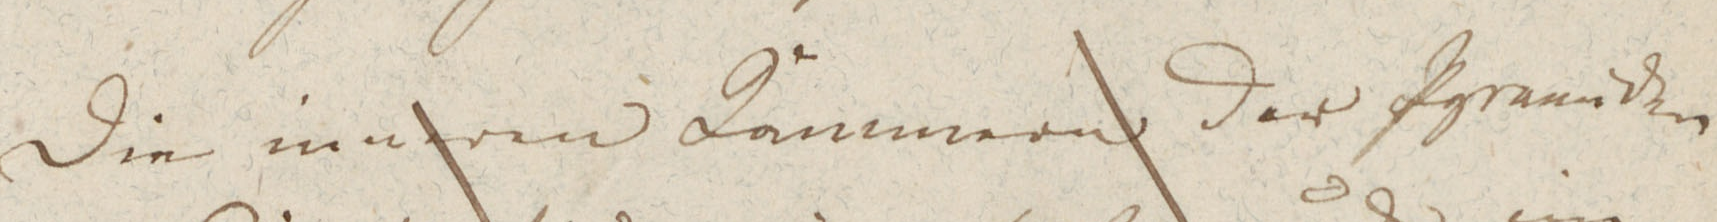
Die inneren Kammern der Pyramiden
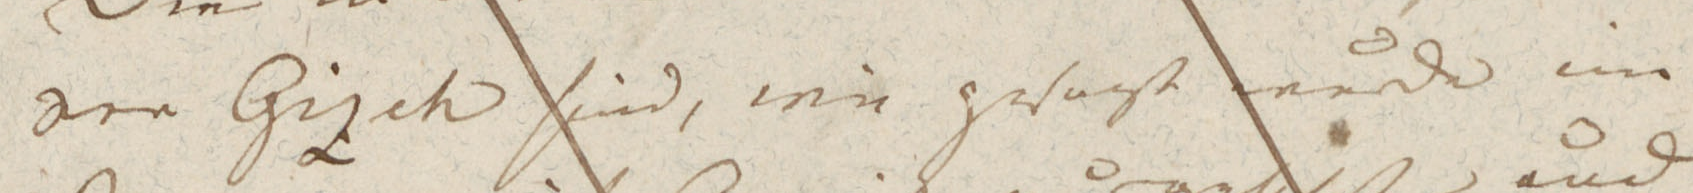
vor Gizeh sind, wie gesagt wurde im
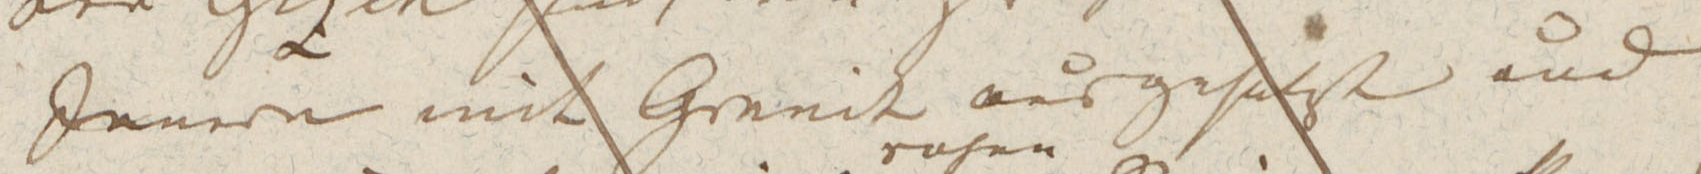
Innern mit Granit ausgesetzt und
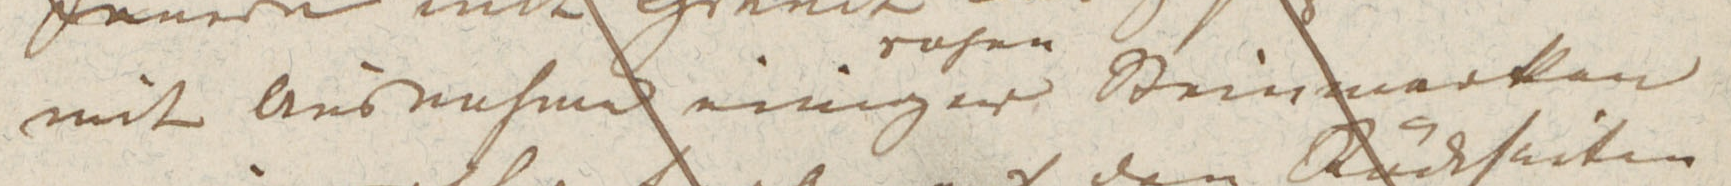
mit Ausnahme einiger rohen Steinmarken
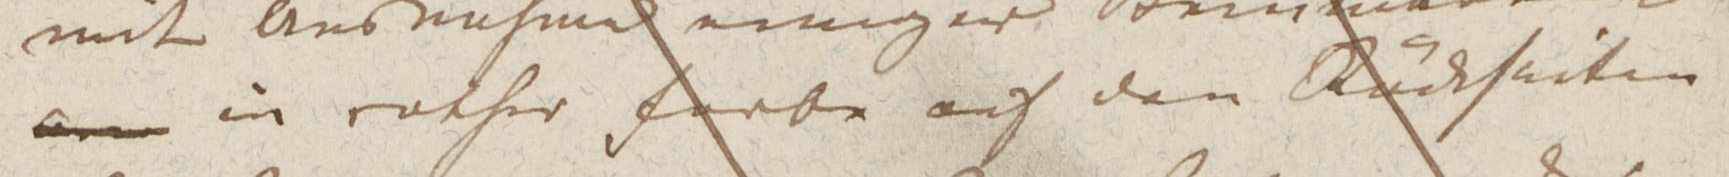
am in rother Farbe auf den Rückseiten
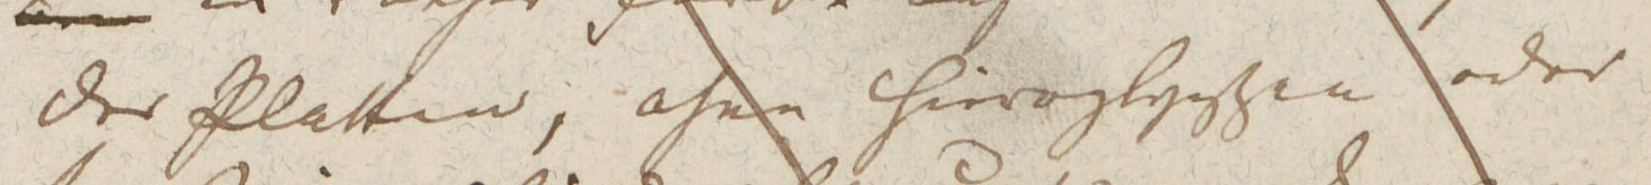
der Platten, ohne Hieroglyphen oder
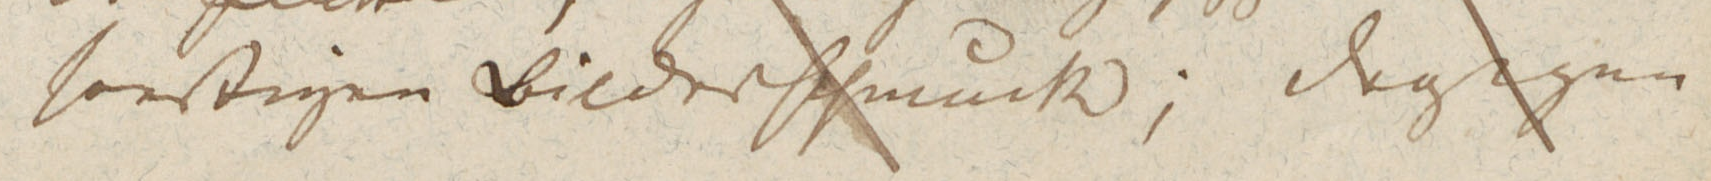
sonstigen Bilderschmuck; Dagegen
